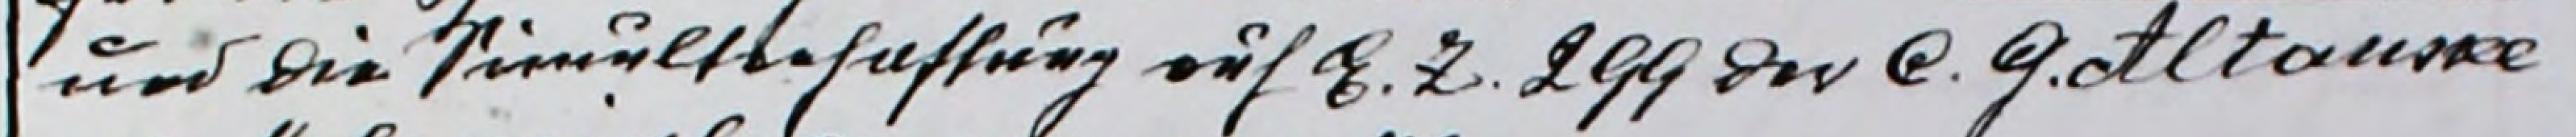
und die Simultanhaftung auf E.Z. 299 der C.G. Altaussee
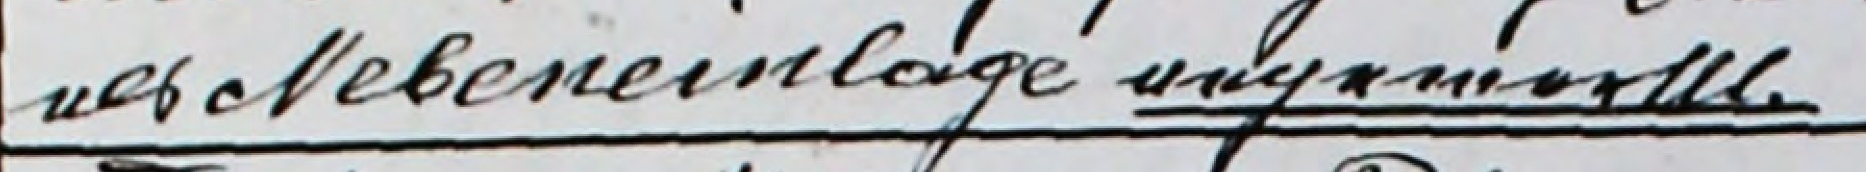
als Nebeneinlage angemerkt.
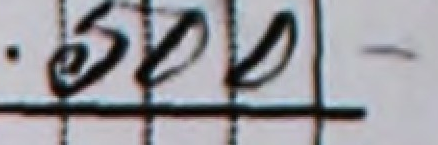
500
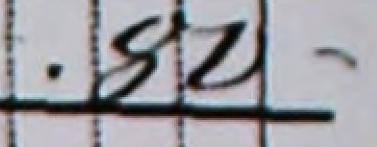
80
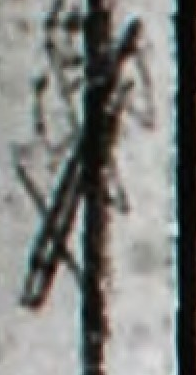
???
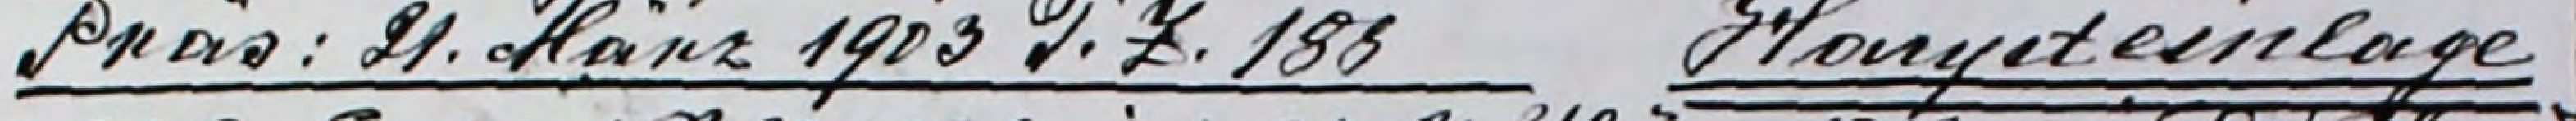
Präs: 21. März 1903 T.Z. 188 Haupteinlage
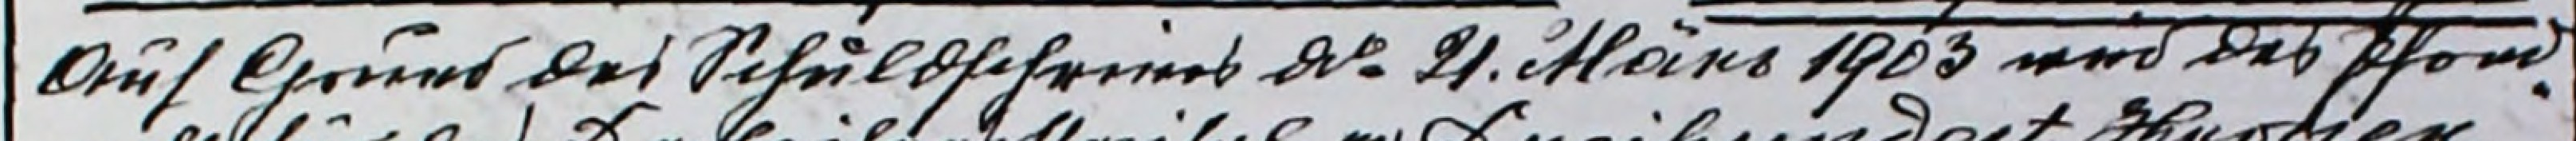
Auf Grund des Schuldscheines ddo 21. März 1903 wird das Pfand„
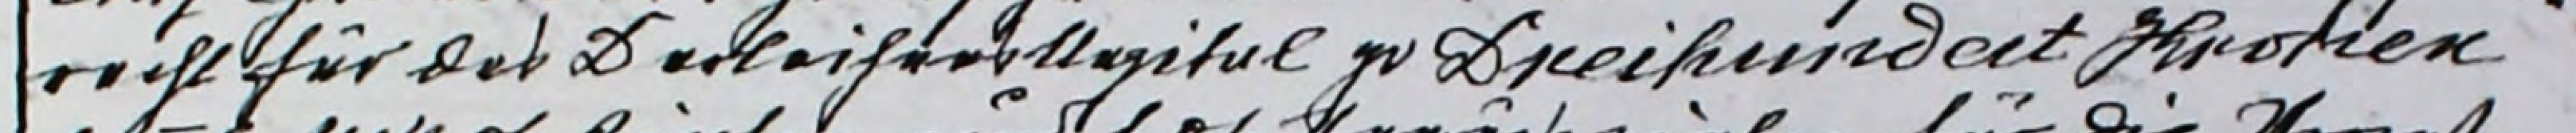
recht für des Darleihenskapital pr Dreihundert Kronen
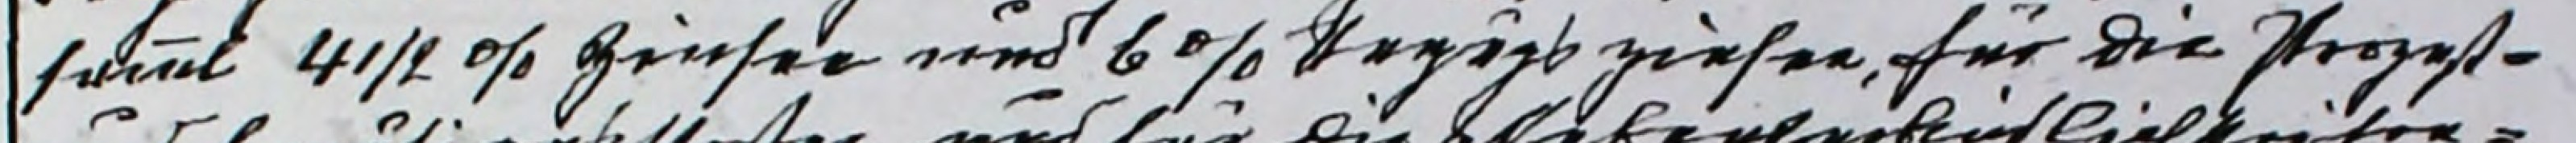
sammt 4 1/2 Zinsen und 6 % Verzugszinsen, für die Prozest=
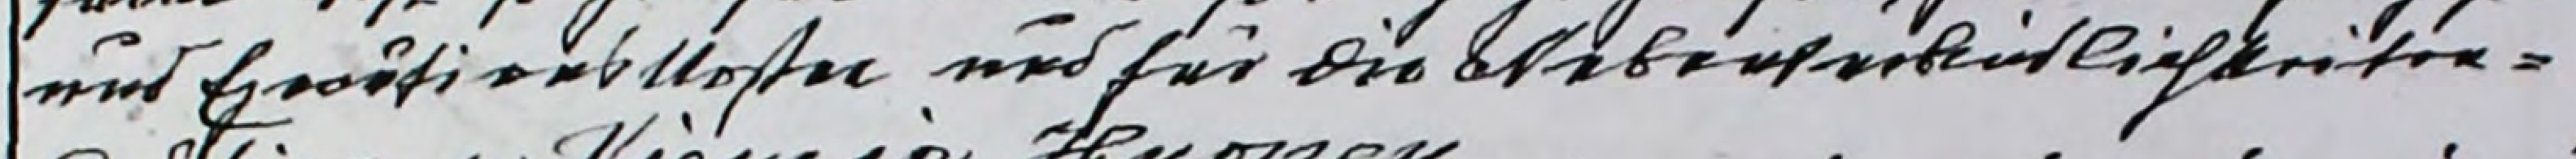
und Executionskosten und für die Nebenverbindlichkeiten=
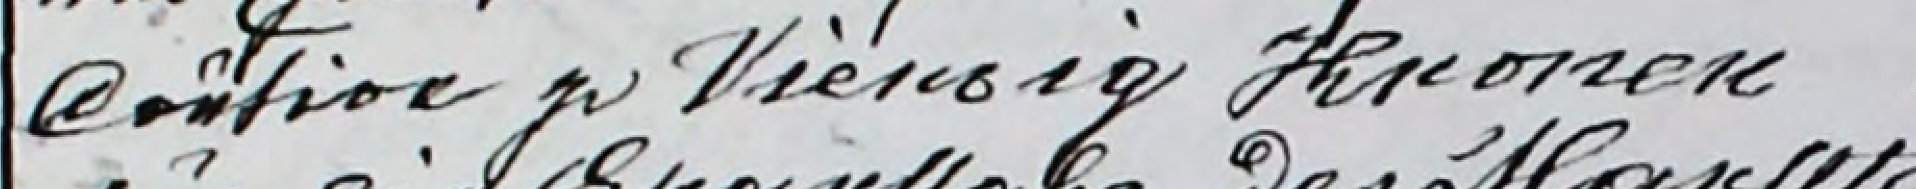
Caution pr Vierzig Kronen
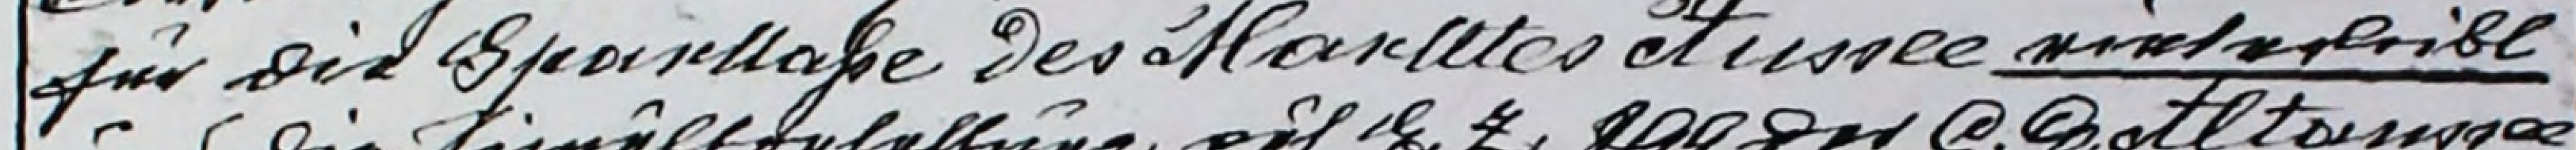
für die Sparkasse des Marktes Aussee einverleibt
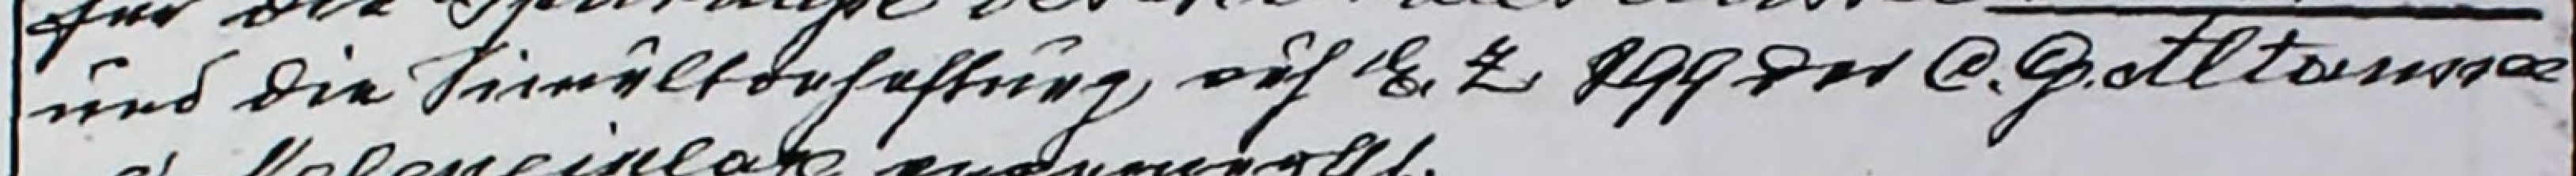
und die Simultanhaftung auf E.Z. 299 der C.G. Altaussee
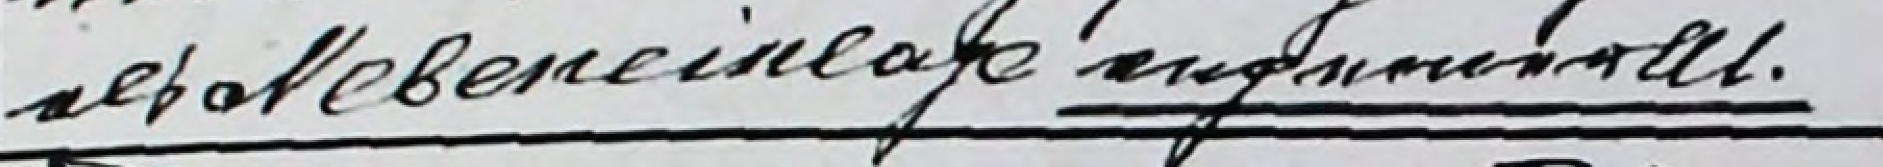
als Nebeneinlage angemerkt.
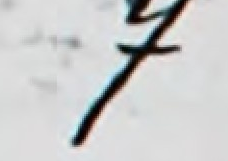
7
